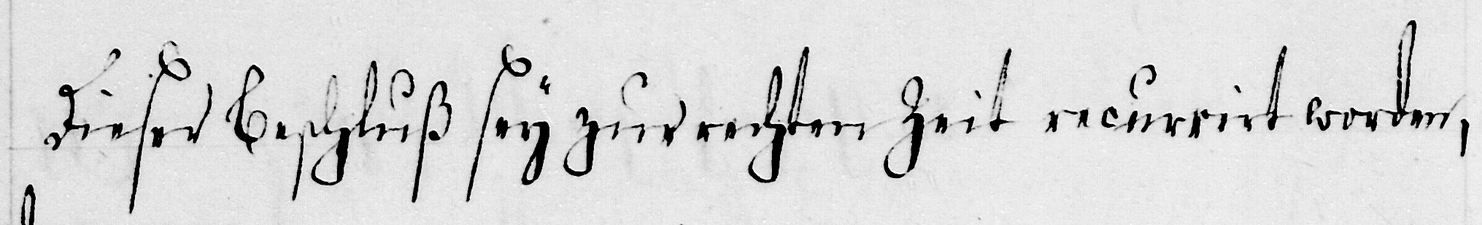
Dieser Beschluß sey zur rechten Zeit recurrirt worden,
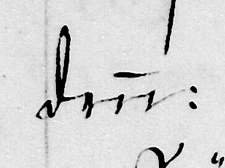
denn:
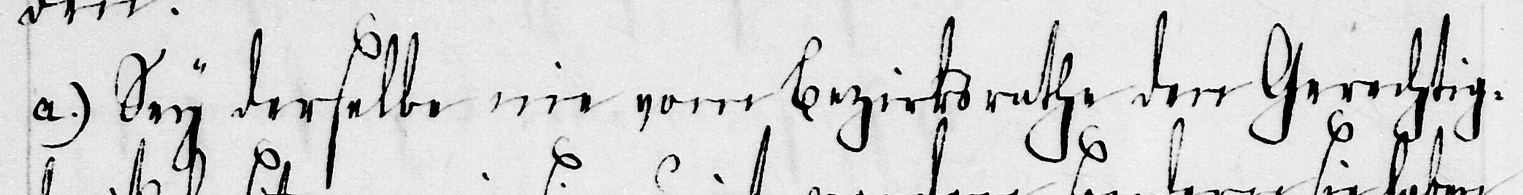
a.) Sey derselbe nie vom Bezirksrathe den Gerechtig¬
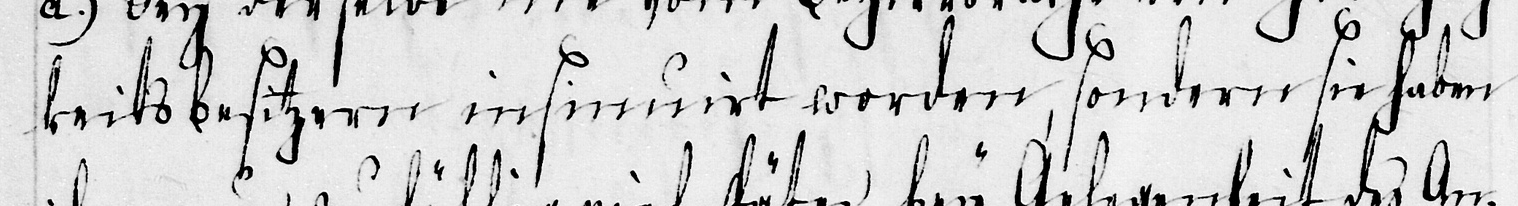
keitsbesitzern insinuirt worden, sondern sie haben
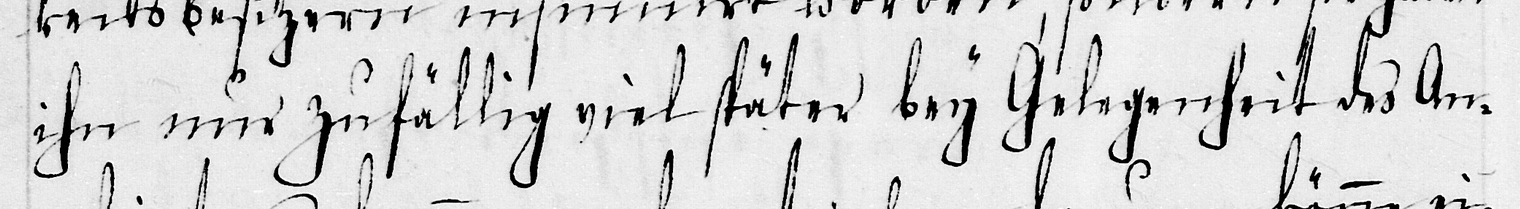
ihr nur zufällig viel später bey Gelegenheit des An¬
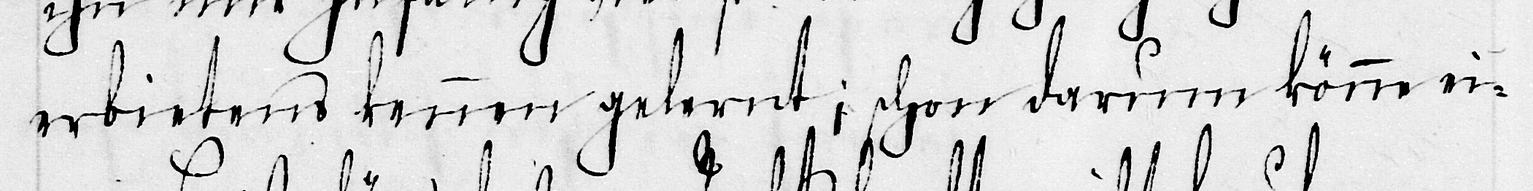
erbietens kennen gelernt; schon darum könne ei¬
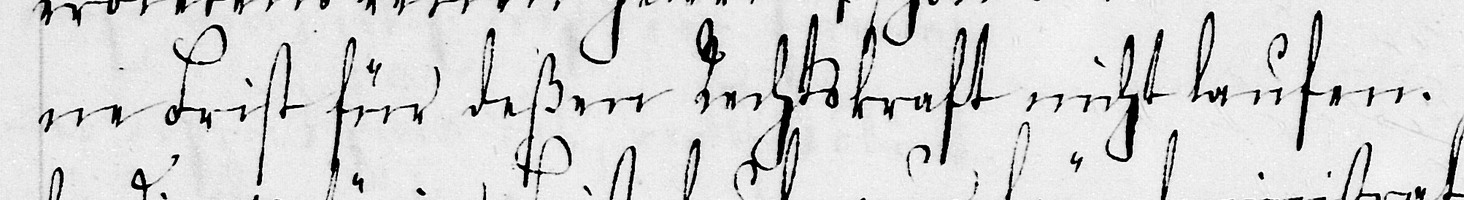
ne Frist für deßen Rechtskraft nicht laufen.
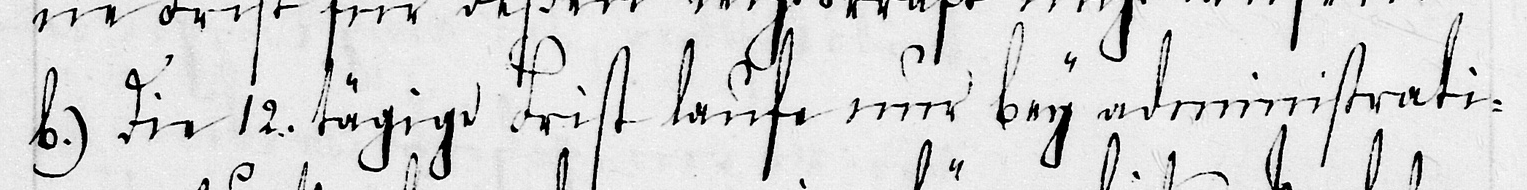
b.) Die 12. tägige Frist laufe nur bey administrati¬
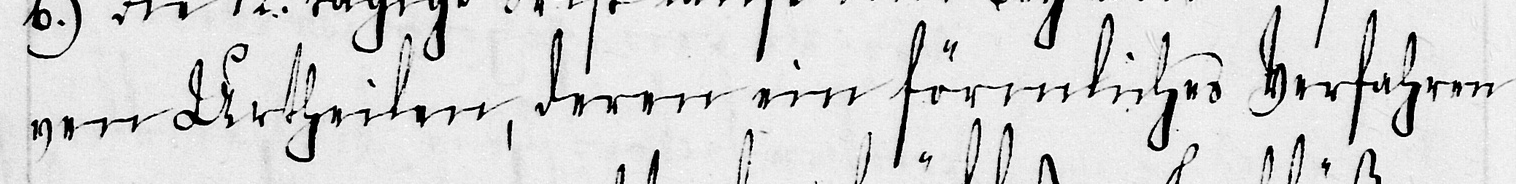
ven Urtheilen, deren ein förmliches Verfahren
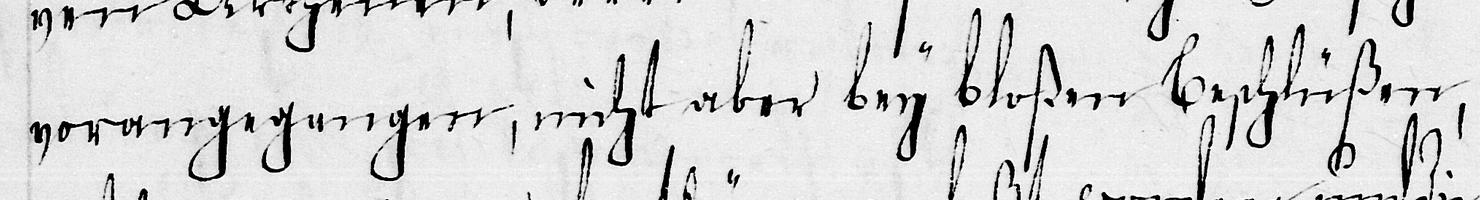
vorangegangen, nicht aber bey bloßen Beschlüßen,
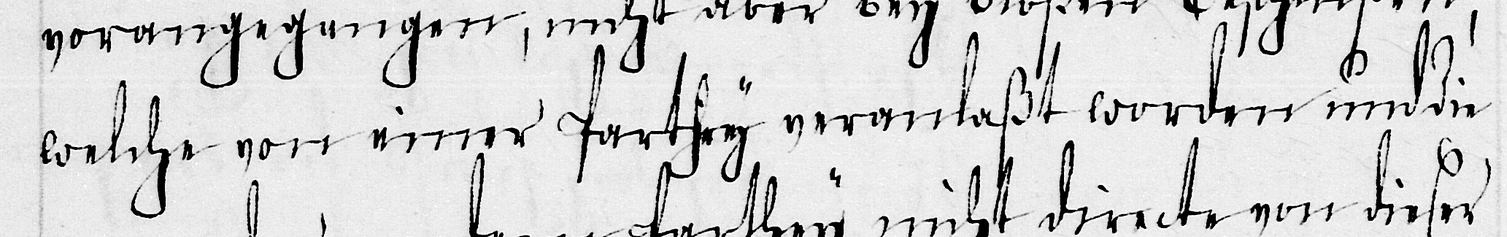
welche von einer Parthey veranlaßt worden und die
